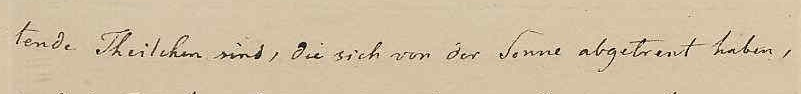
tende Theilchen sind, die sich von der Sonne abgetrent haben,
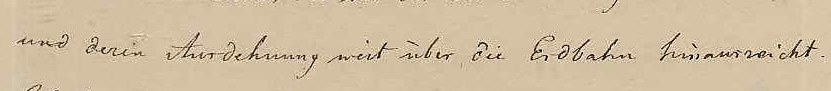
und deren Ausdehnung weit über die Erdbahn hinausreicht.
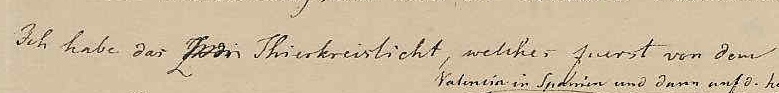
Ich habe das ZodiThierkreislicht, welches zuerst von dem
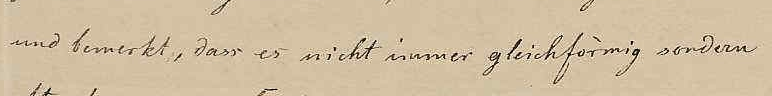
und bemerkt, dass es nicht immer gleichförmig sondern
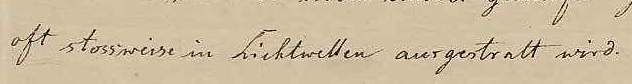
oft stossweise in Lichtwellen ausgestralt wird.
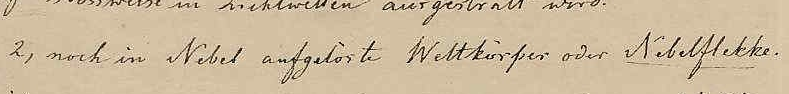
2, noch in Nebel aufgelöste Weltkörper oder Nebelflekke
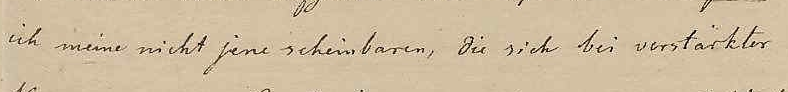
ich meine nicht jene scheinbaren, die sich bei verstärkter
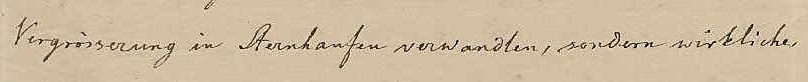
Vergrösserung in Sternhaufen verwandlen, sondern wirkliche
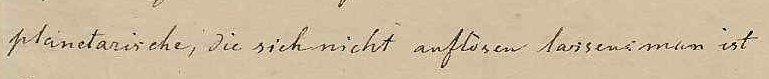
planetarische, die sich nicht auflösen lassen: man ist
